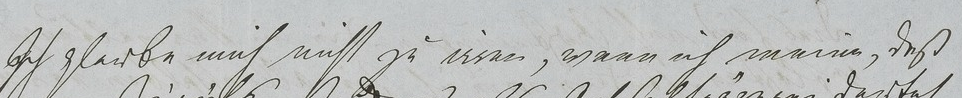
Ich glaube mich nicht zu irren, wenn ich meine, daß
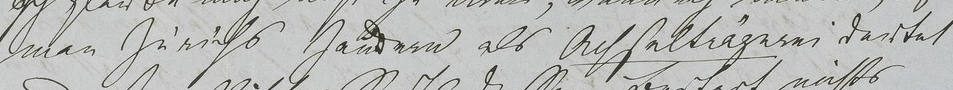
man Zürichs Zaudern als Achselträgerei deutet
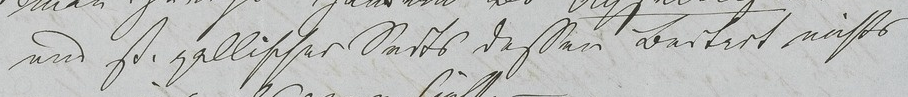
und st.gallischer Seits deßen Beitrit nichts
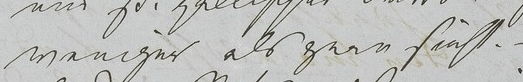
weniger als gern sieht. –
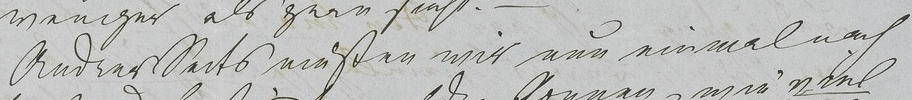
Andrer Seits müßen wir nun einmal nach
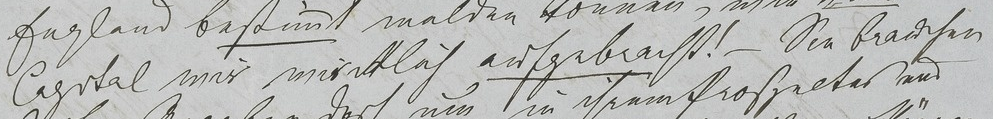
Capital wir wircklich aufgebracht! – Sie brauchen
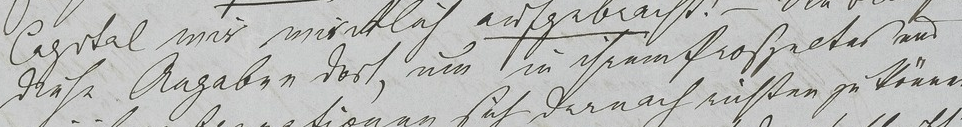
diese Angaben dort, um in ihrem Prospectus und
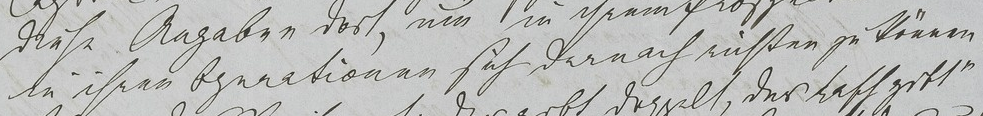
in ihren Operationen sich darnach richten zu können.
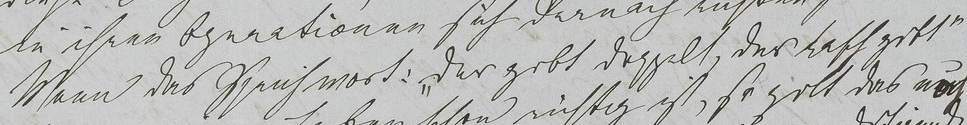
Wenn das Sprichwort: «Der gibt doppelt, der rasch gibt»
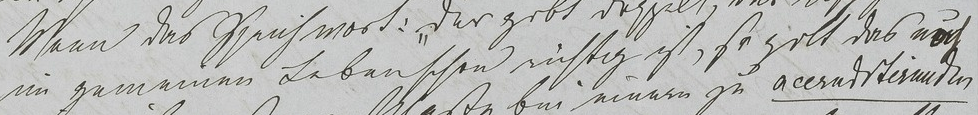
im gemeinen Leben schon richtig ist, so gilt das noch
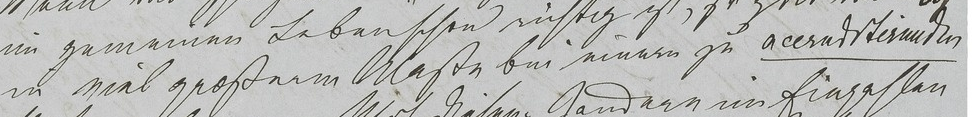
in viel größerm Maße bei einem zu accreditirenden
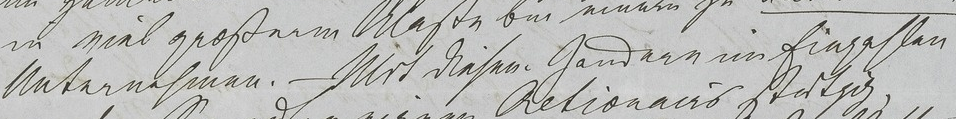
Unternehmen. – Mit diesem Zaudern im Einzahlen
